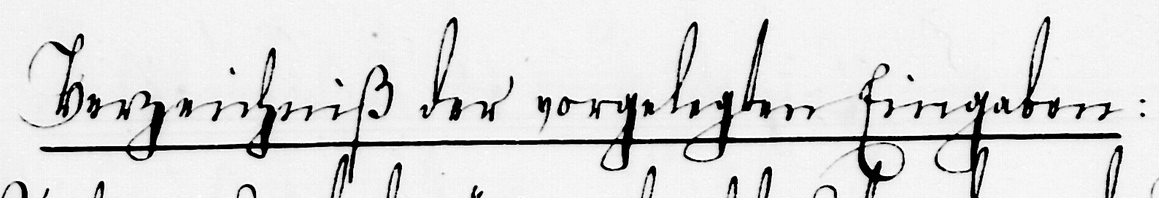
Verzeichniß der vorgelegten Eingaben:
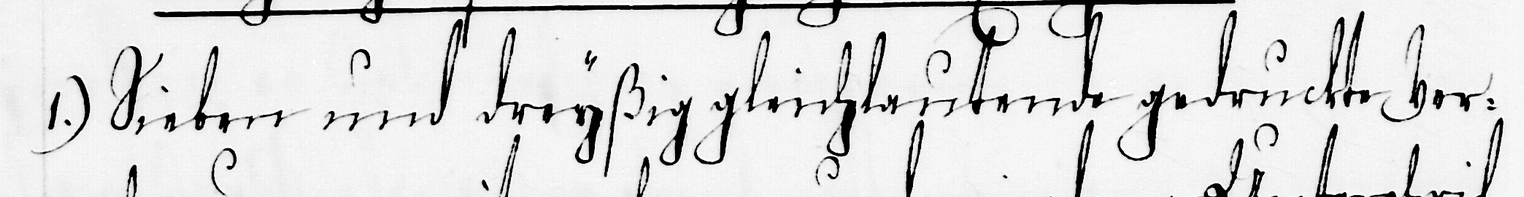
1.) Sieben und dreyßig gleichlautende gedruckte Ver¬
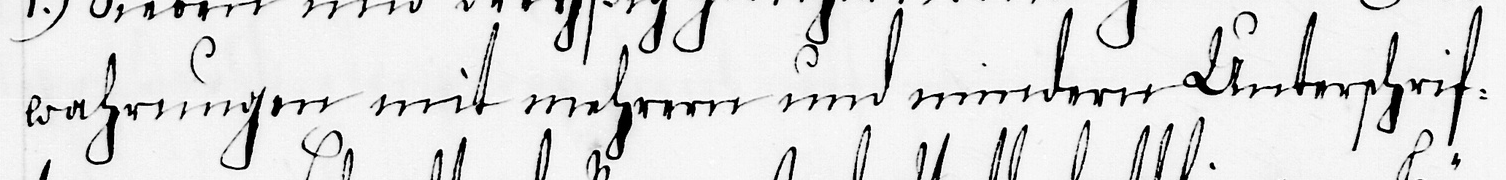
wahrungen mit mehrern und mindern Unterschrif¬
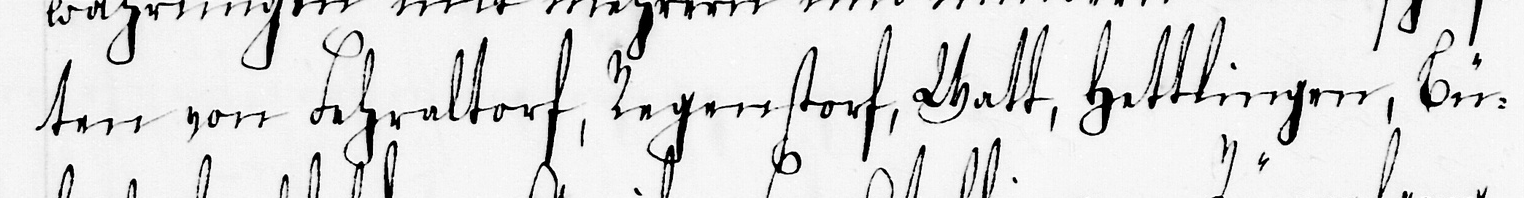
ten von Fehraltorf, Regenstorf, Watt, Hettlingen, Bü¬
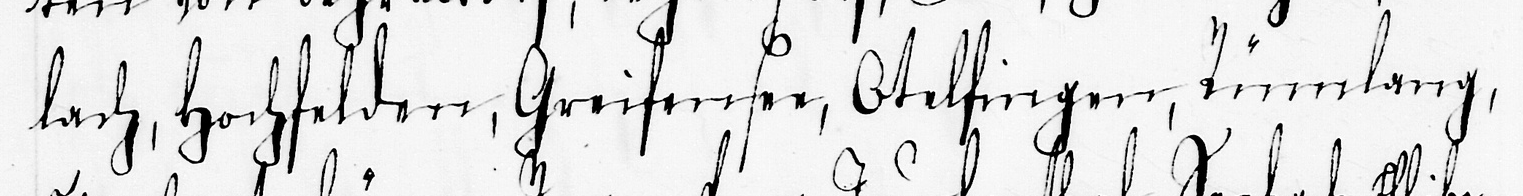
lach, Hochfelden, Greifensee, Otelfingen, Rümlang,
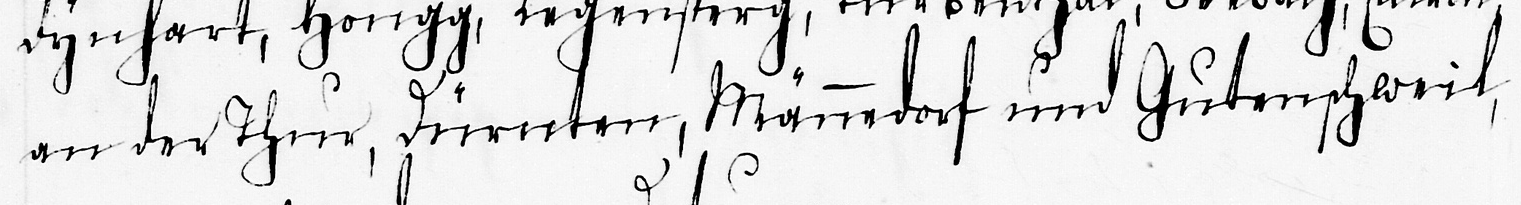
an der Thur, Dürnten, Männedorf und Gutenschweil,
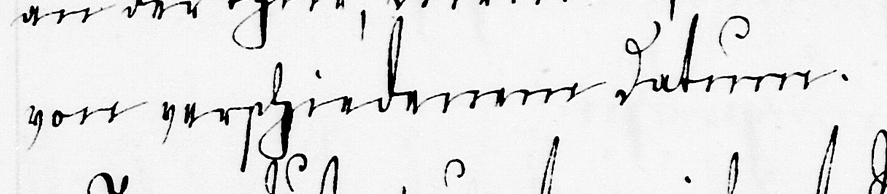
von verschiedenem Datum.
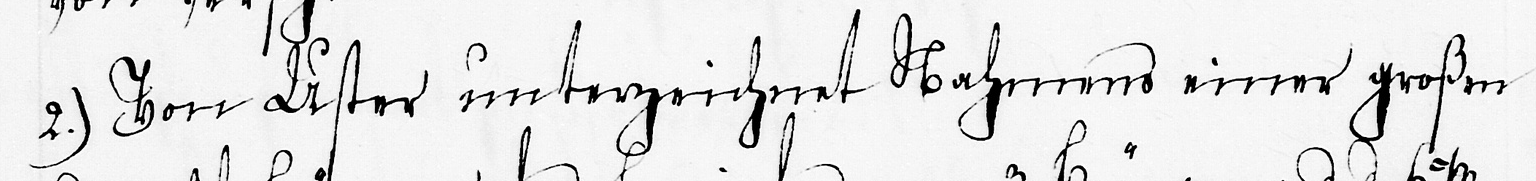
2.) Von Uster unterzeichnet Nahmens einer großen
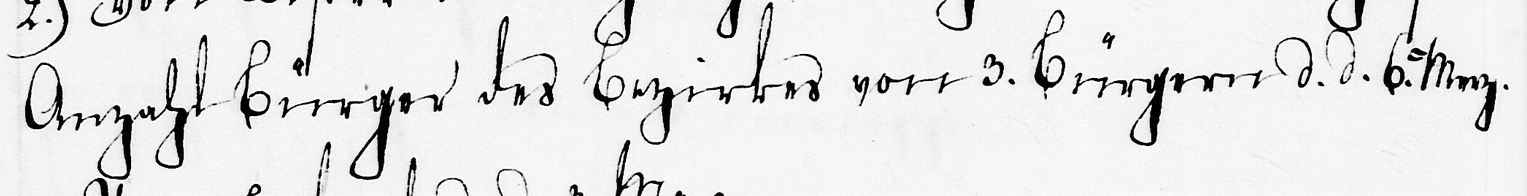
Anzahl Bürger des Bezirkes von 3. Bürgern d. d. 6. März.
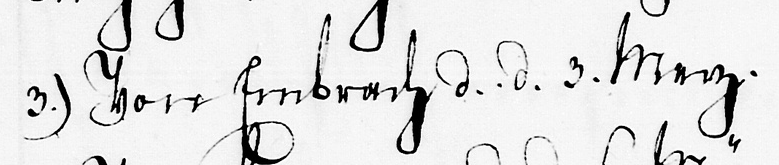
3.) Von Embrach d. d. 3. März.
